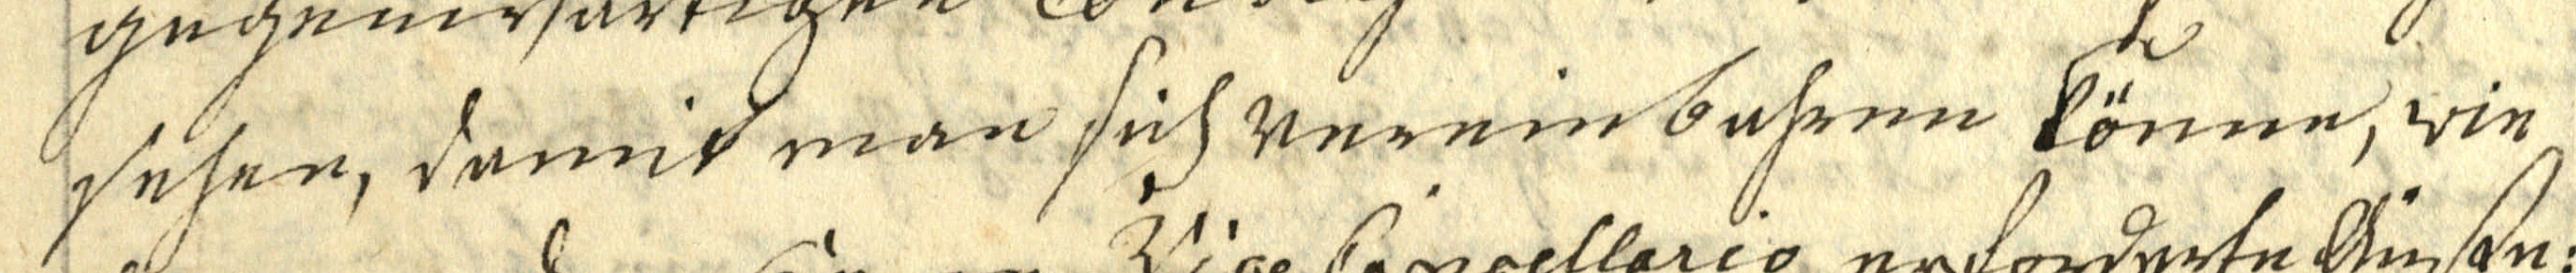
sehen, damit man sich vereinbahren könne, wie
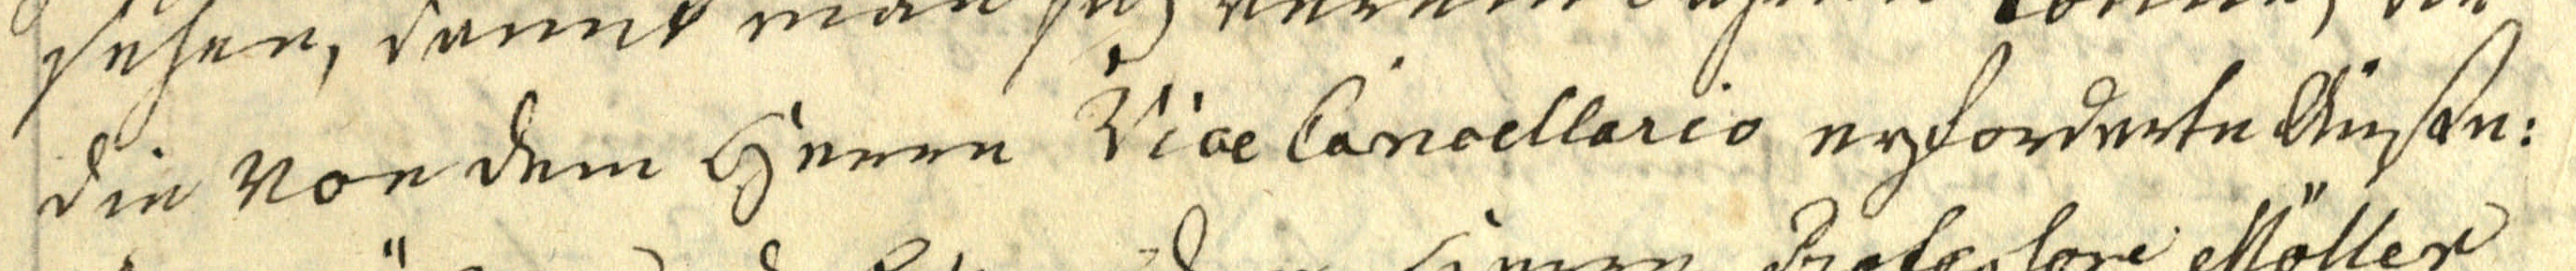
die von dem Herrn Vice Cancellario erforderte Äuße¬
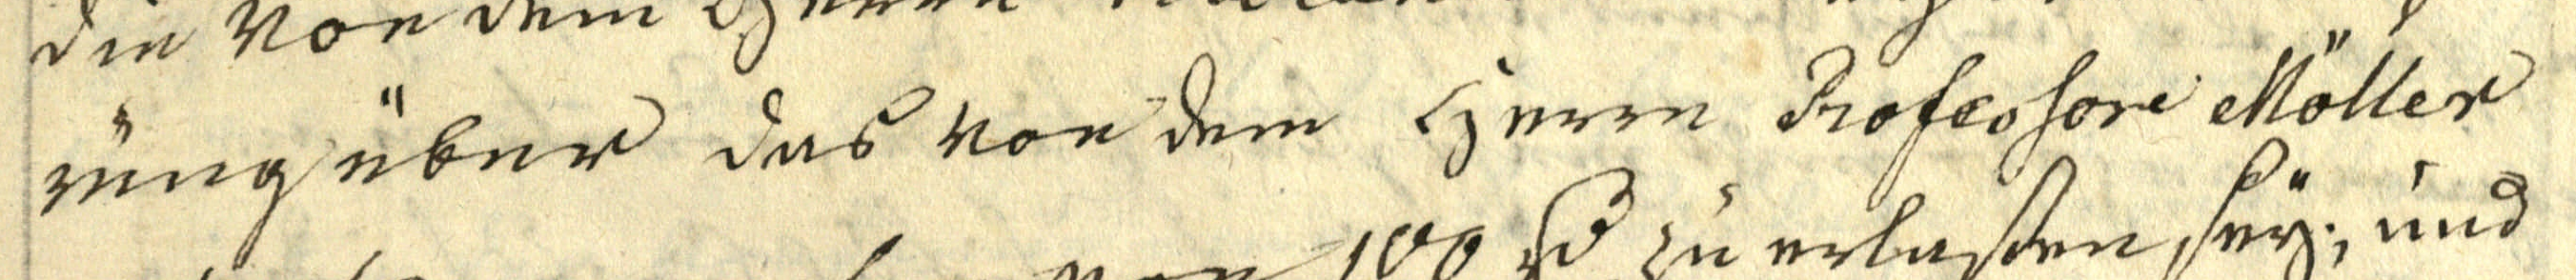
rung über das von dem Herrn Professore Möller
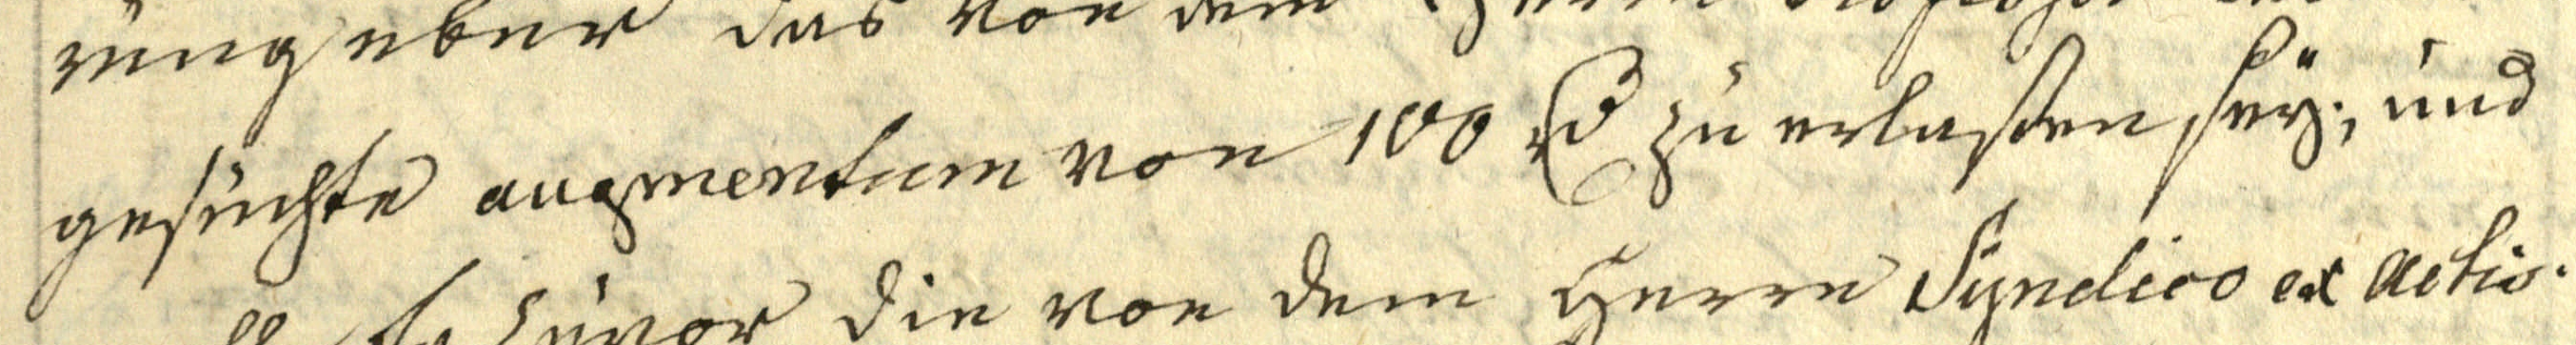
gesuchte augmentum von 100 rt zu erlaßen seÿ; und
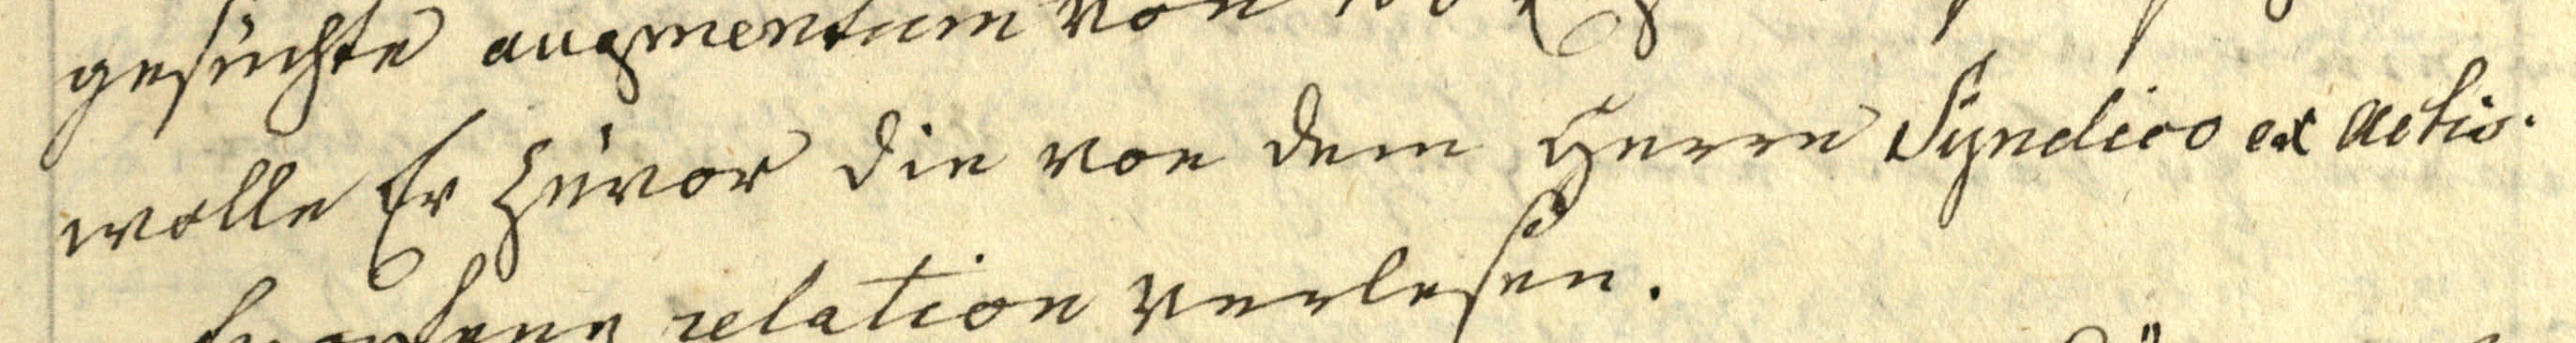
wolle Er zuvor die von dem Herrn Sÿndico ex Actis
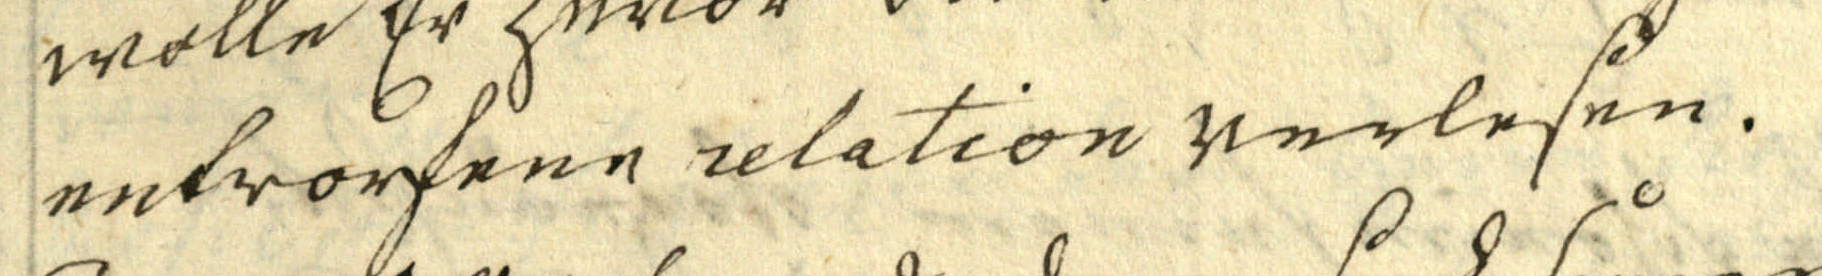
entworfene relation verlesen.
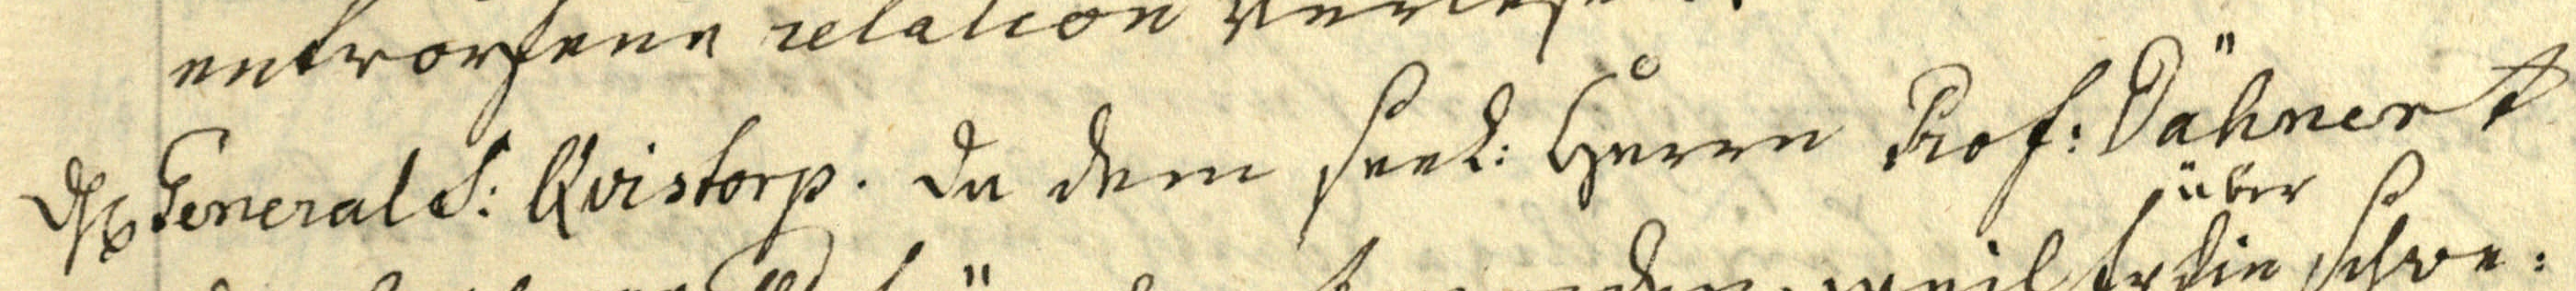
dh GeneralS. Quistorp. Da dem seel. Herrn Prof. Dähnert
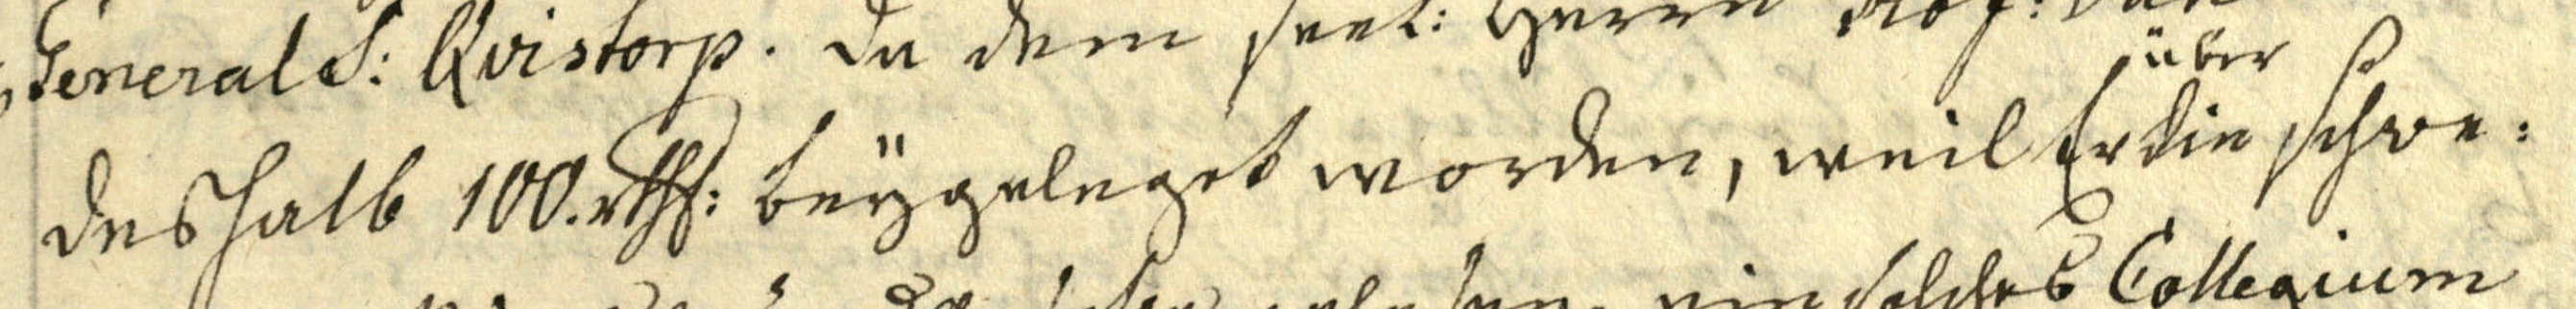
deshalb 100 rthl beÿgeleget worden, weil Er über die schwe¬
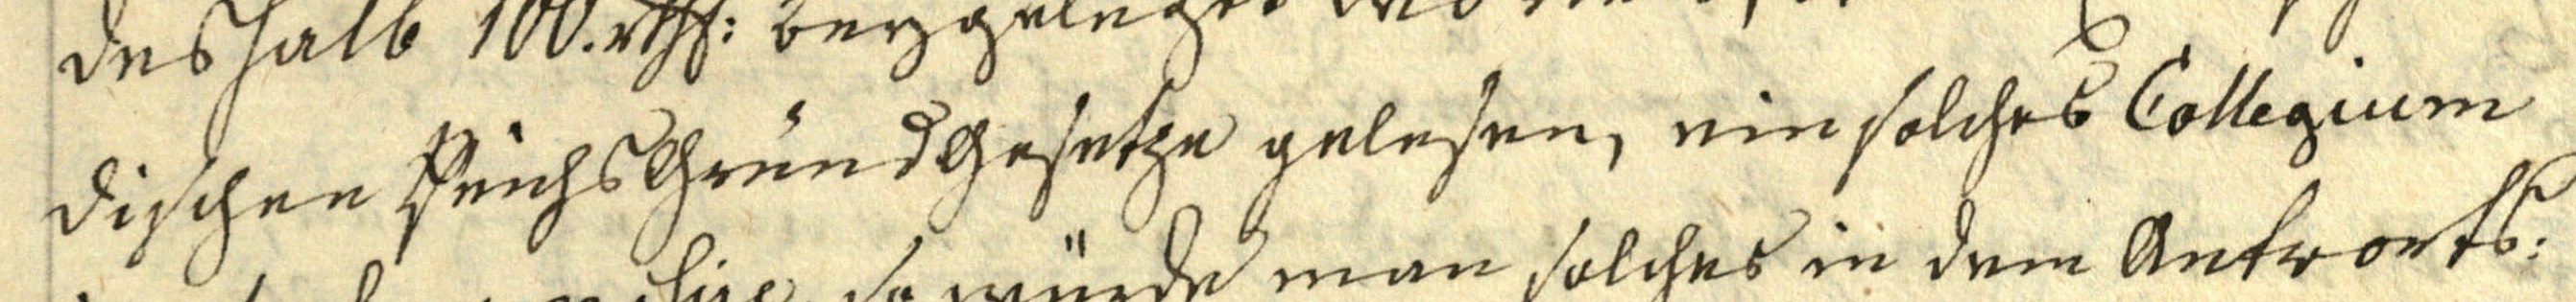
dischen Reichs Grundgesetze gelesen, ein solches Collegium
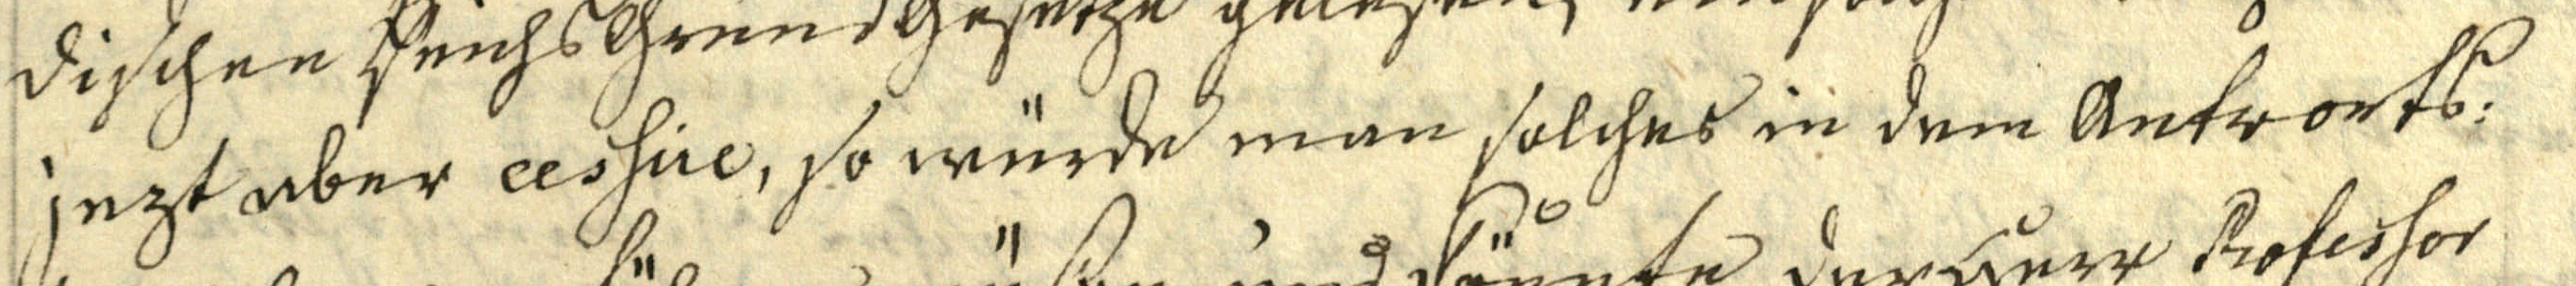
jezt aber cessire, so würde man solches in dem Antworts
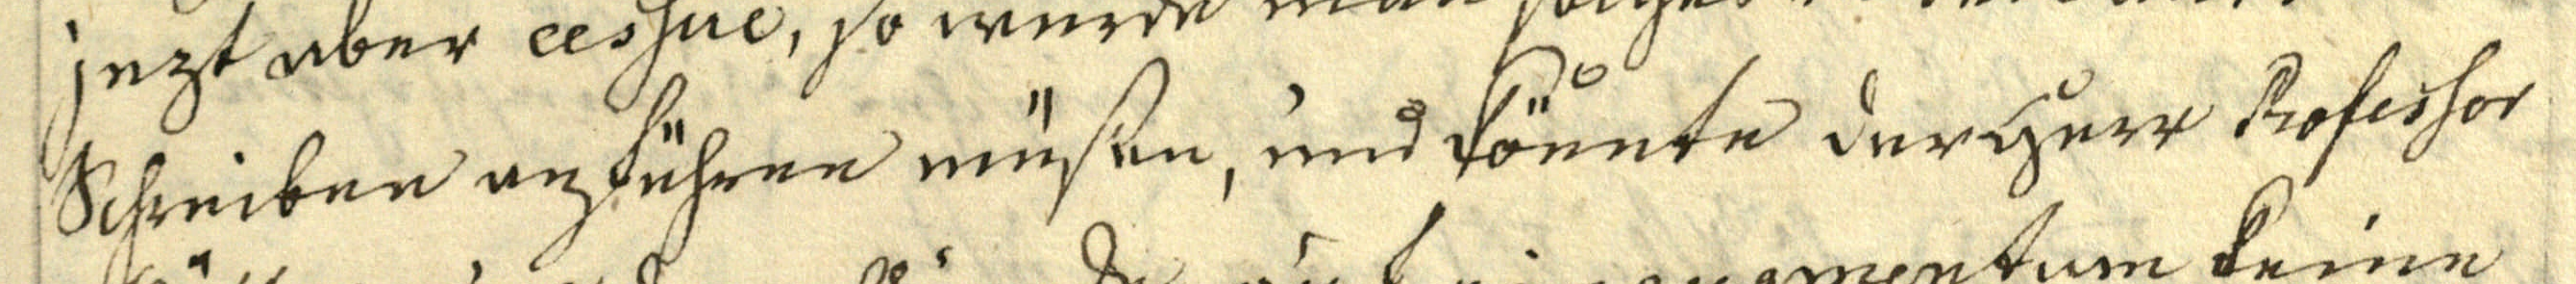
Schreiben an führen müßen, und könnte der Herr Professor
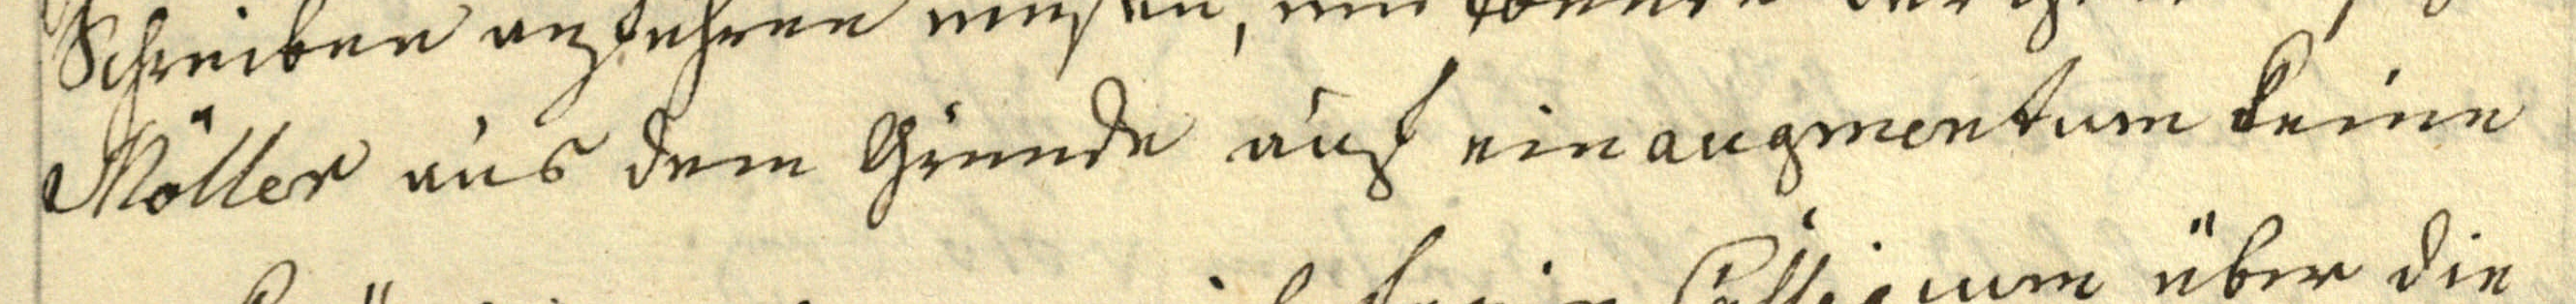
Möller aus dem Grunde auf ein augmentum keine
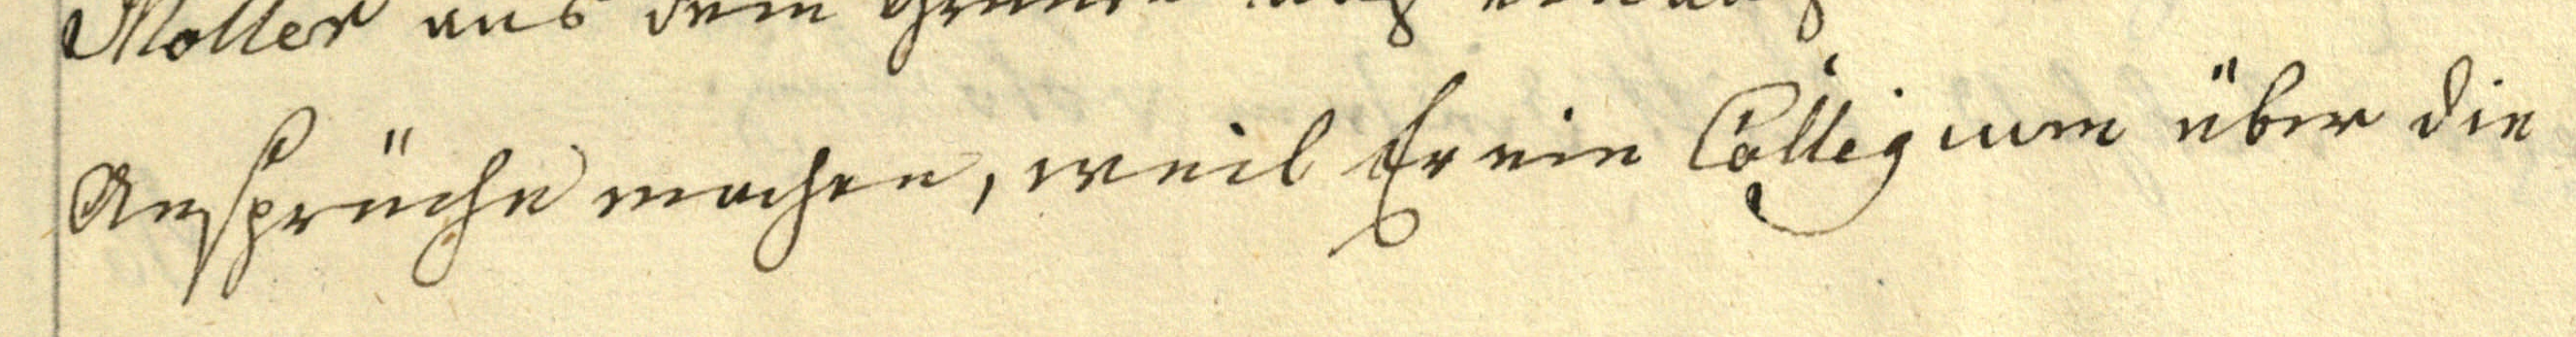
Ansprüche machen, weil Er ein Collegium über die
